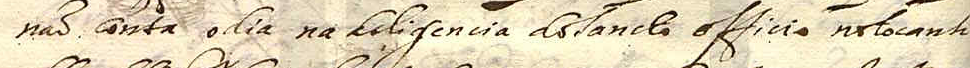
não conta o dia na deligencia do Sancto officio no tocante
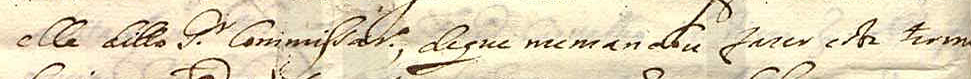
elle ditto S.r Commissar.o, de que me mandou fazer este termo
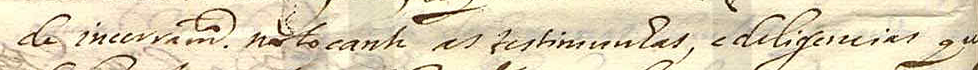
de incerramto. no tocante as testimunhas, e deligencias qu
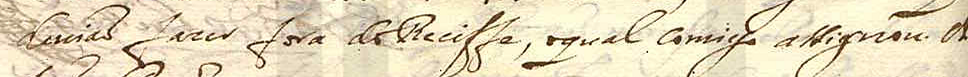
deuiaõ fazer fora de Reciffe, o qual comigo assignou d
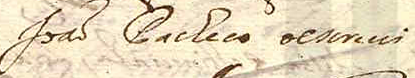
Joaõ Pacheco o escreui
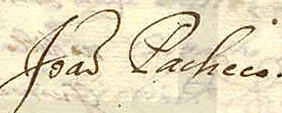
Joaõ Pacheco.
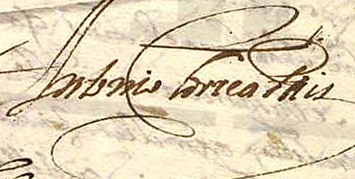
Antonio Correa Miz
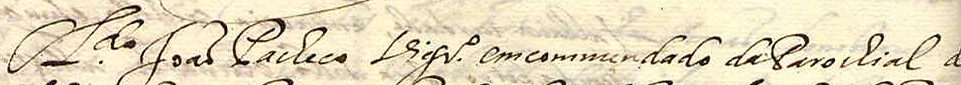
O L.do Joaõ Pacheco Vigr.o emcommendado da Parochial d
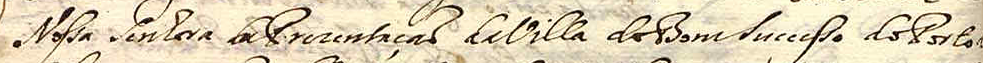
Nossa Senhora da Prezentaçaõ da Villa do Bom Successo do Porto
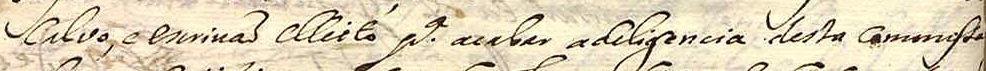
Calvo, e escriuão elleito p.a acabar a deligencia desta commissa
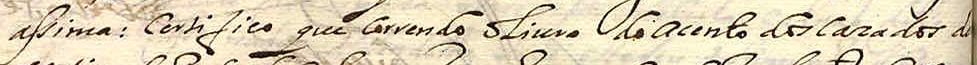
assima: Certifico que correndo o Liuro do acento dos cazados d
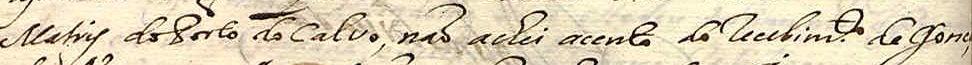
Matris do Porto do Calvo, naõ achei acento do Recebim.to de Gonç
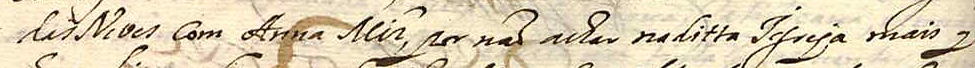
das Neves com Anna Miz̄, por naõ achar na ditta Igreja mais qu
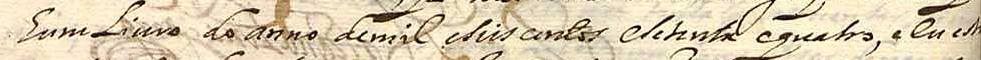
hum Liuro do anno de mil e seiscentos e setenta e quatro, e Eu es
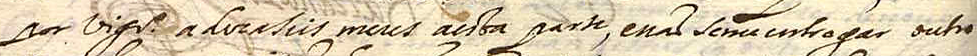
por vigr.o a dezaseis mezes a esta parte, e naõ sem entregar outro
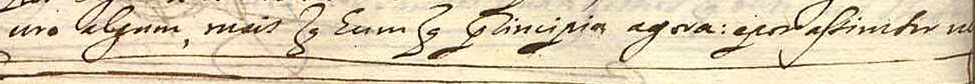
uro algum, mais q̄ hum q̄ principia agora: e por assim ser ue
